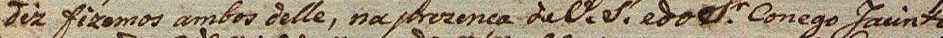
diz fizemos ambos delle, na prezença de V. S. e do S.r conego Jacinto
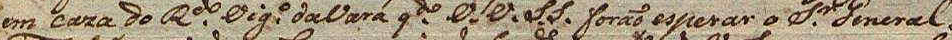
em caza do Rdo. Vig.o da Vara q.do V.V. S.S. foraõ esperar o S.r General.
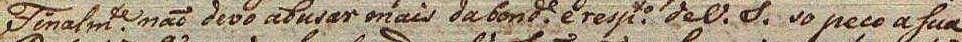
Finalmte. não devo abusar mais da bonde. e respto. de V.S. so peço a sua
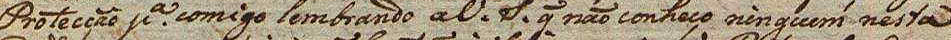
Protecção pa. comigo lembrando a V.S. q̄ não conheço ninguem nesta
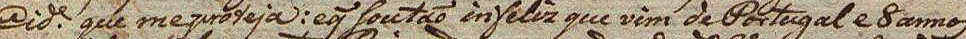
Cide. que me proteja: e q̄ sou taõ infeliz que vim de Portugal e 8 annos
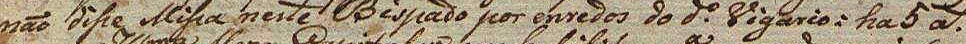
não disse Missa neste Bispado por enredos do d.o Vigario: ha 5 a.s
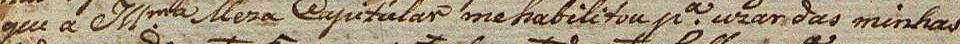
que a Ill.ma Meza Capitular me habilitou pa. uzar das minhas
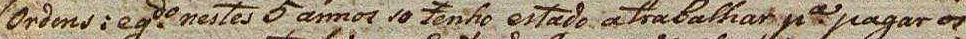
Ordens: e q.do nestes 5 annos so tenho estado a trabalhar pa. pagar os
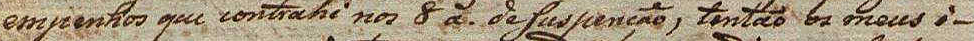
empenhos que contrahi nos 8 as. de suspenção, tentão os meus i
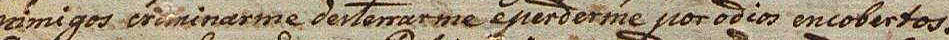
nimigos criminarme desterrar-me e perderme por odios encobertos:
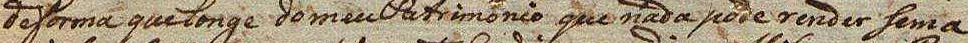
de forma que longe do meu Patrimonio que nada pode render sem a
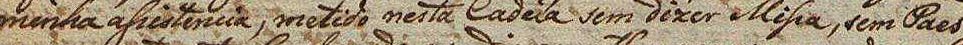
minha assistencia, metido nesta Cadeia sem dizer Missa, sem Paes
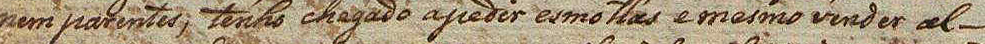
nem parentes, tenho chegado a pedir esmollas e mesmo vender al
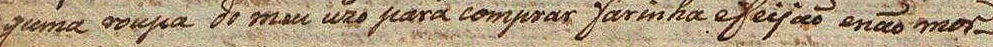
guma roupa de meu uzo para comprar farinha e feijaõ e não mor
